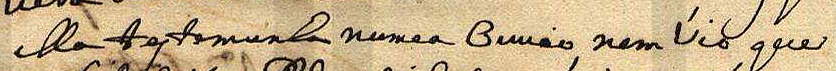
ella testemunha numca Ouuio, nem vio, que
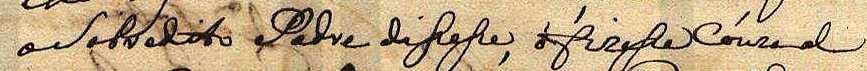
o Sobredito Padre dissesse, ó fizesse Couza al
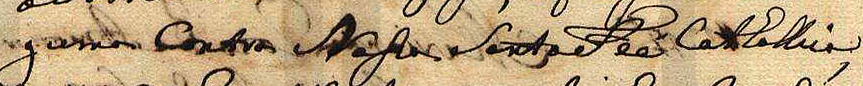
guma Contra Nossa Santa Feé Cathollica,
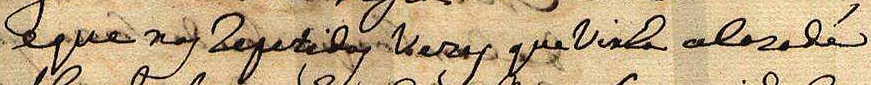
e que nas Repetidas Vezes que vinha a Caza de
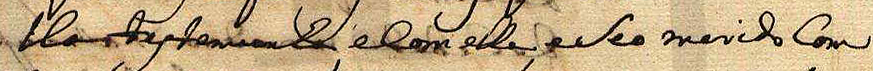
lla testemunha, e Com ella, e seo marido Com
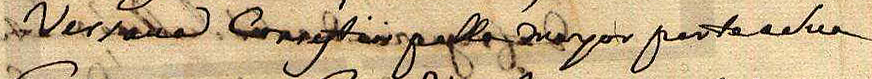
Versaua Consestio pella mayor parte a sua
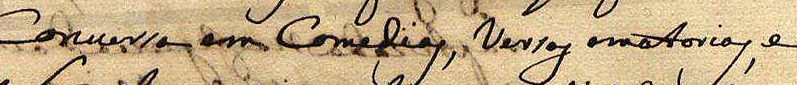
Conuersa em Comedias, versos amatorios, e
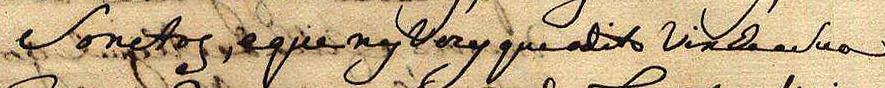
Sonetos, e que nas Vezes que o dito Vinha a sua
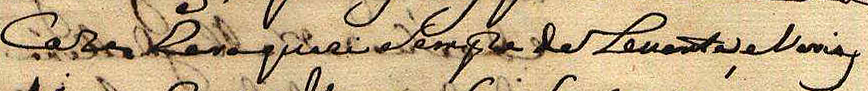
Caza hera quazi SempRe de Leuante, e Varias
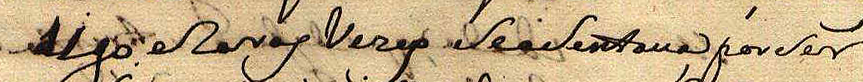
digo e Raras Vezes se aSentaua por ser
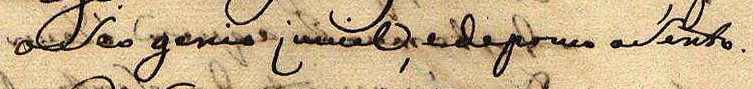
o Seo genio juuial, e de pouco aSento.
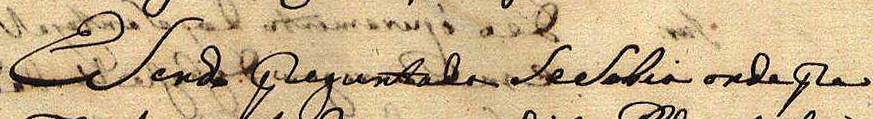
E Sendo pReguntada se Sabia onde pRe
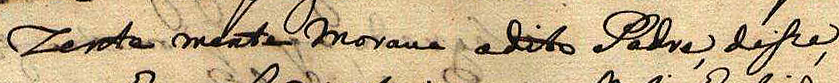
Zentemente moraua o dito Padre, disse
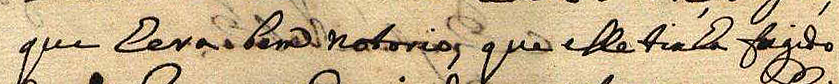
que hera bem notorio, que elle tinha fugido
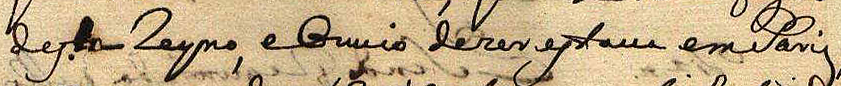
deste Reyno, e Ouuio dezer estaua em Paris
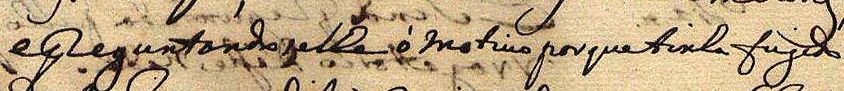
e pReguntandoselhe ó motiuo porque tinha fugido
